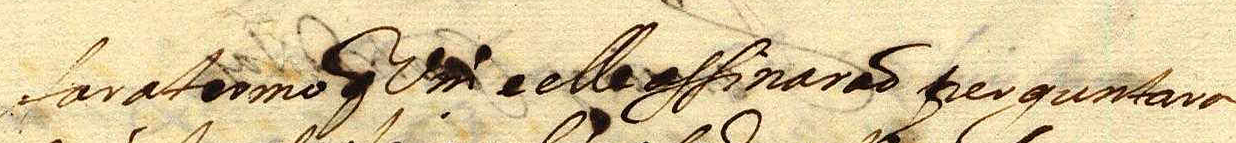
fara termo q̄ Vm e elle assinaraõ perguntara
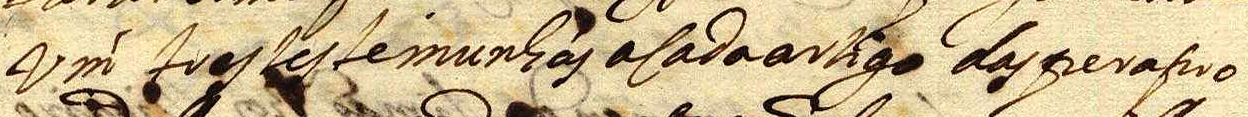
Vm tres testemunhas a Cada artigo das pera pro
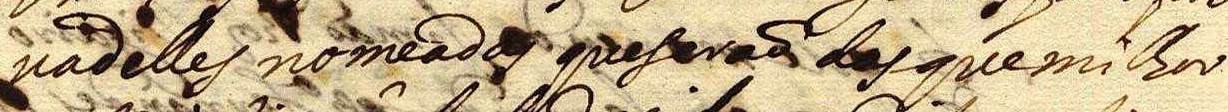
ua delles nomeadas que seraõ das que milhor
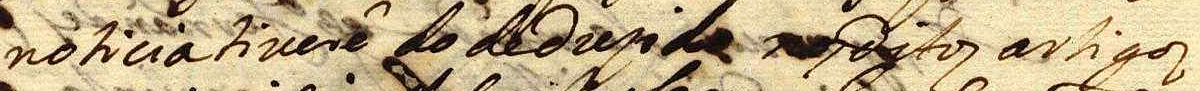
noticia tiuerē do deduzido nos ditos artigos
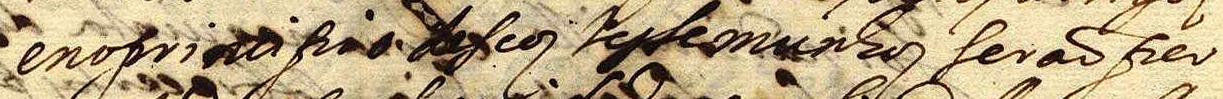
e no principio de seos testemunhos seraõ per
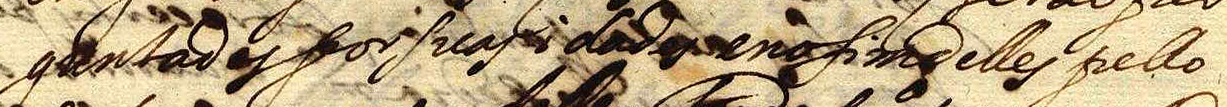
guntadas por suas idades e no fim delles pello
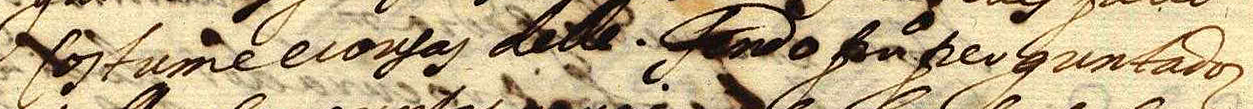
Costume e cousas delle. sendo pro perguntados
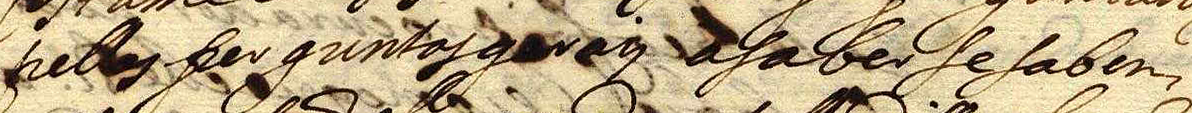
pellas perguntas gerais a saber se sabem
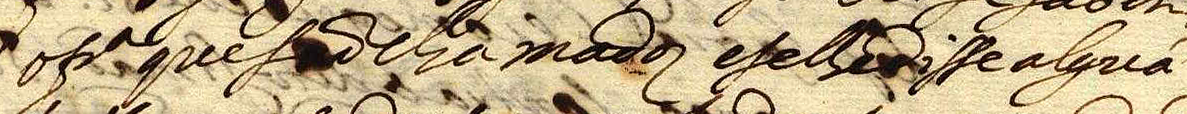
o pa que saõ chamados e se lhe disse alguā
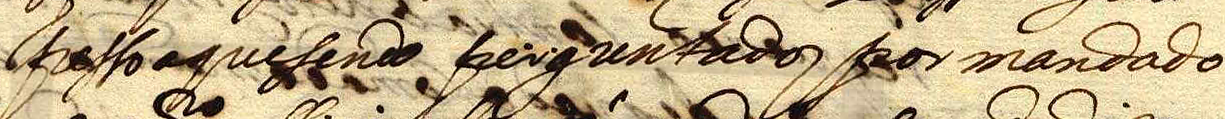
pessoa que sendo perguntados por mandado
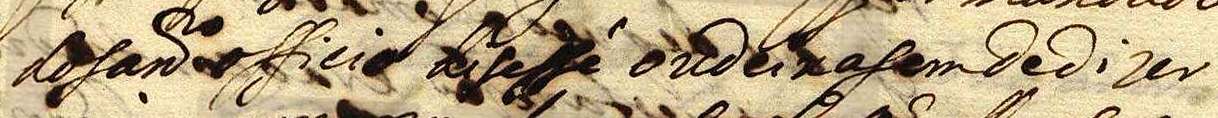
do santo officio disessē ou deixasem de dizer
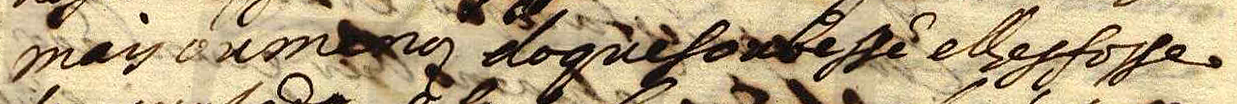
mais ou menos do que soubessē e lhes fosse
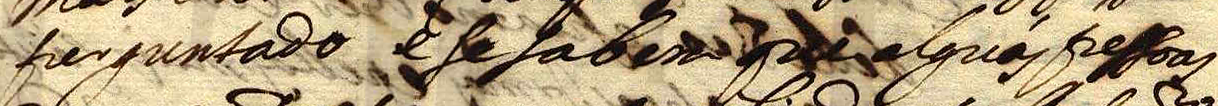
perguntado e se sabem que alguās pessoas
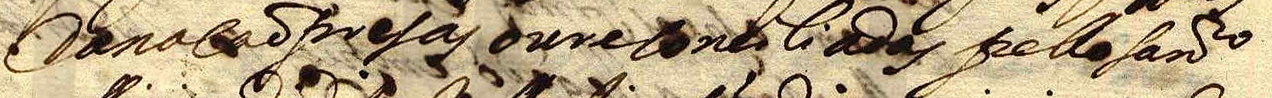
da nacaõ presas ou reconciliadas pello santo
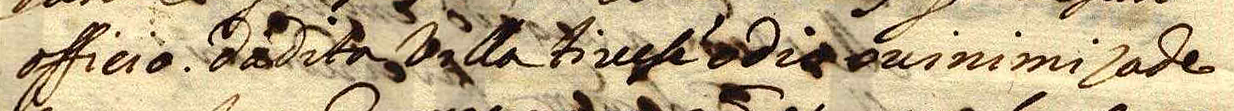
officio. da dita villa tiuesē odio ou inimizade
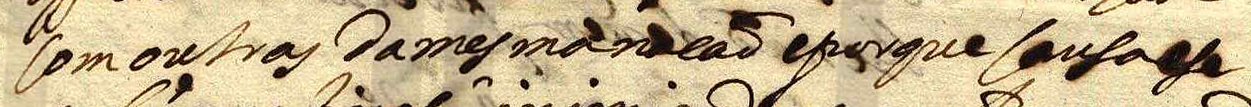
com outras da mesma nacaõ e porque Causa e se
